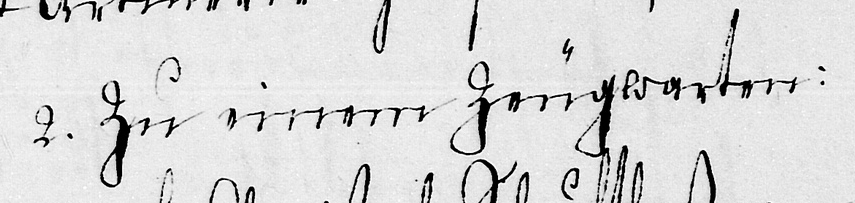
2. Zu einem Zeugwarten:
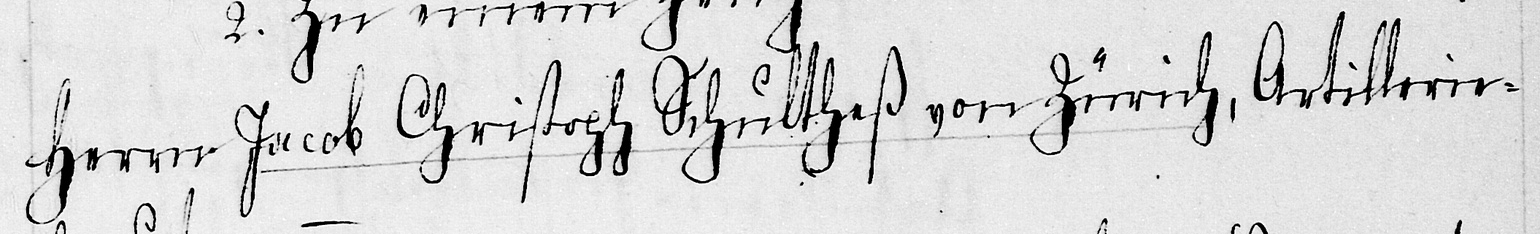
Herrn Jacob Christoph Schultheß von Zürich, Artilleri¬
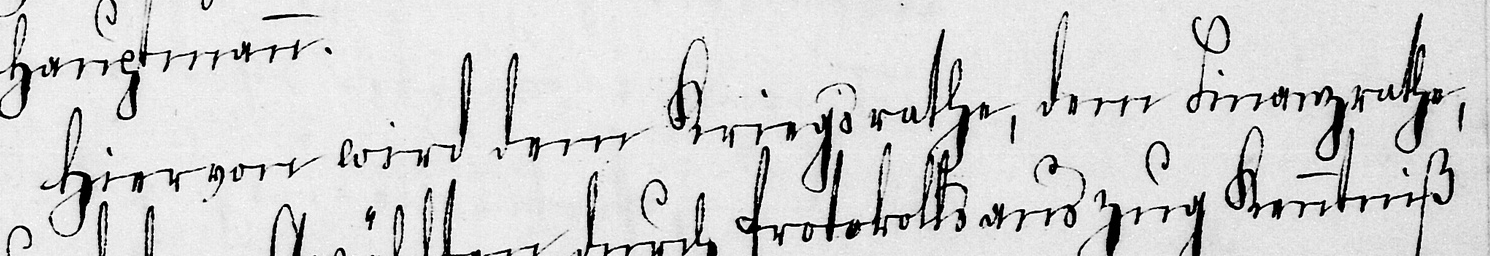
Hiervon wird dem Kriegsrathe, dem Finanzrathe,
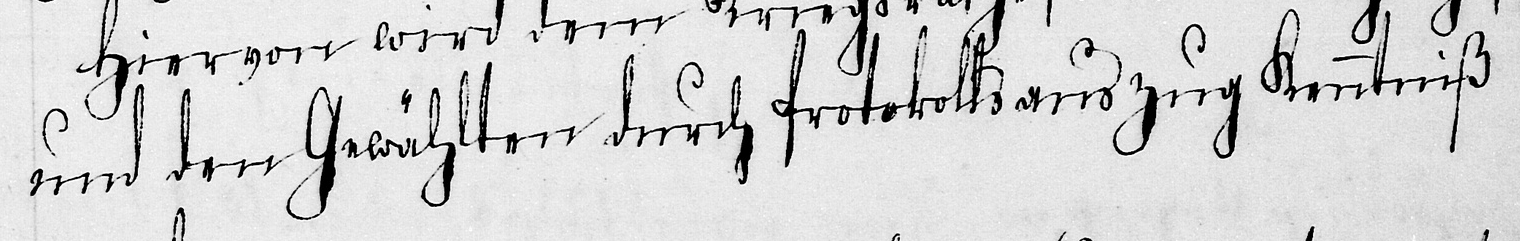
und den Gewählten durch Protokollsauszug Kenntniß
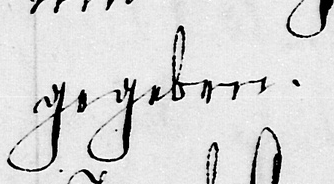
gegeben.
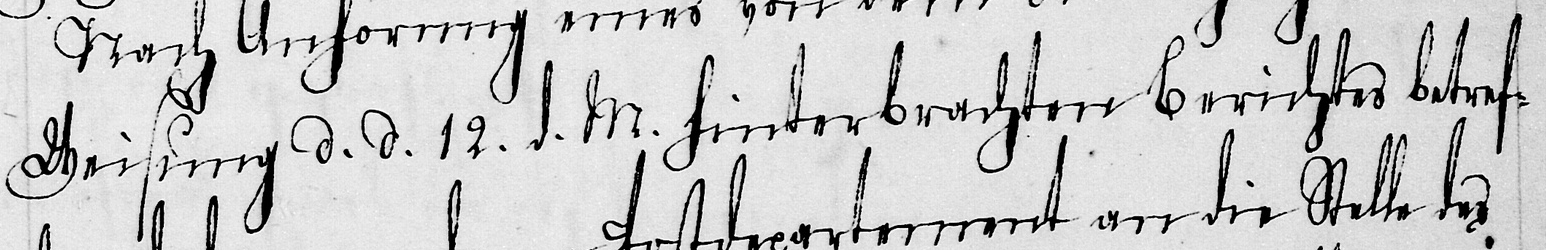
Weisung d. d. 12. d. M. hinterbrachten Berichtes betref¬
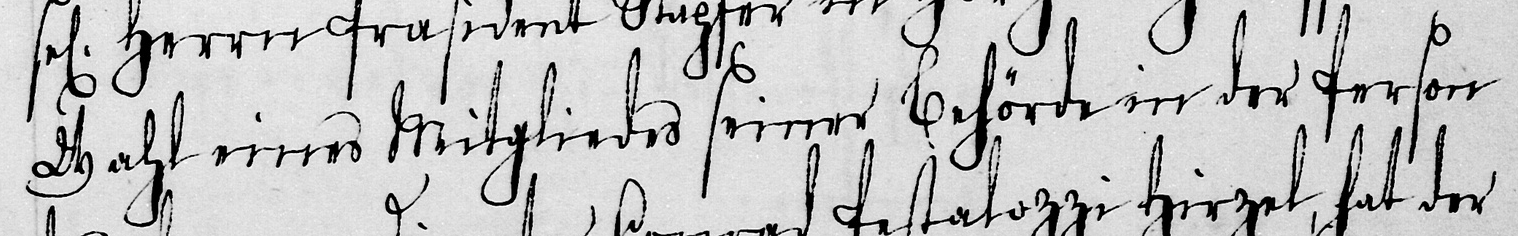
Wahl eines Mitgliedes seiner Behörde in der Person
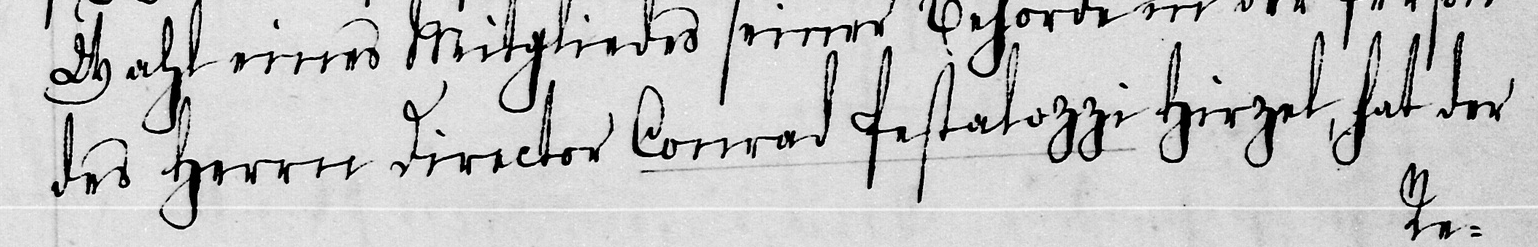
des Herrn Director Conrad Pestalozzi Hirzel, hat der
